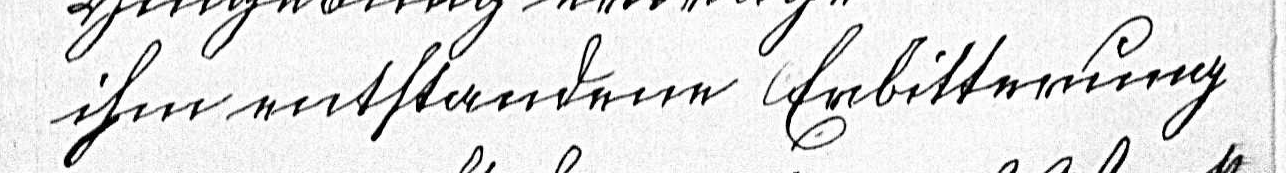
ihm entstandene Erbitterung
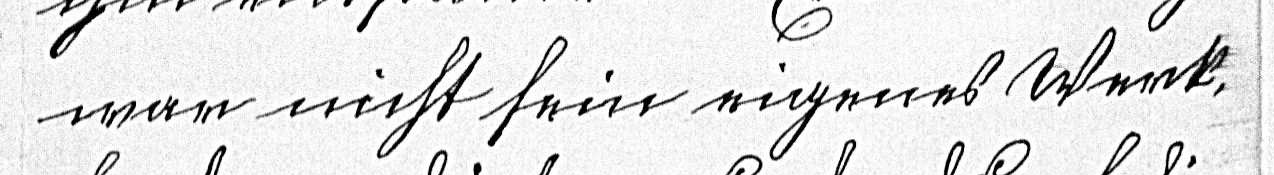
war nicht sein eigenes Werk,
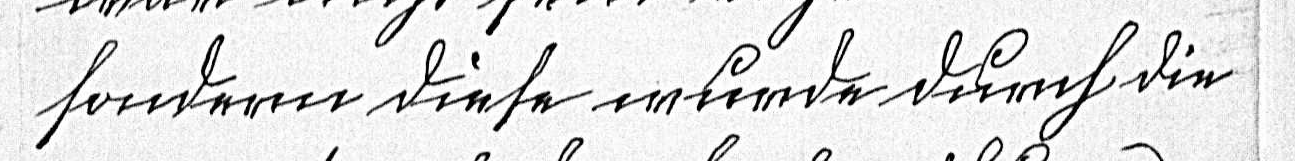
sondern diese wurde durch die
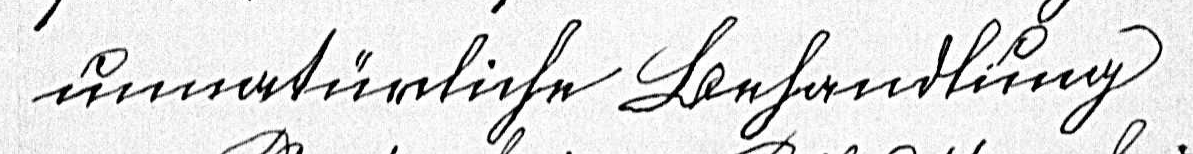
unnatürliche Behandlung
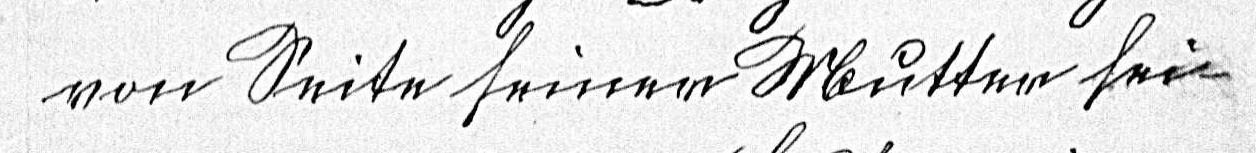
von Seite seiner Mutter sei¬
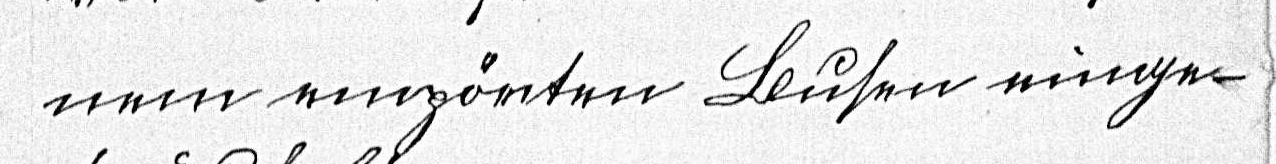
nem empörten Busen einge¬
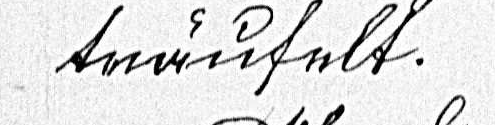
träufelt.
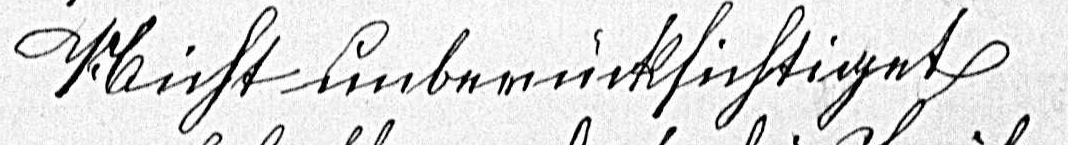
Nicht unberücksichtiget
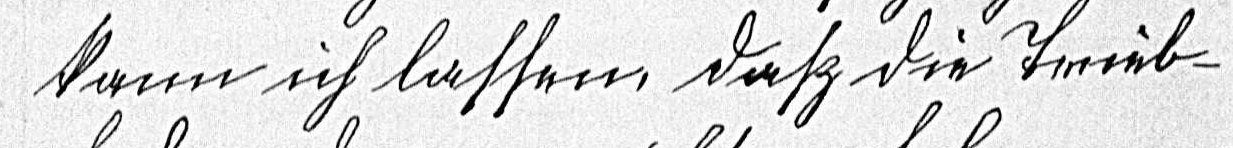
kann ich lassen, daß die Trüb¬
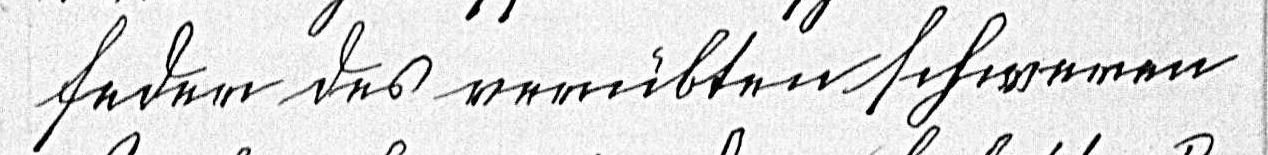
faden des verübten schweren
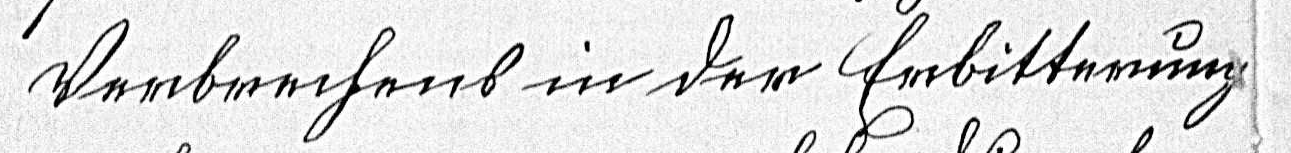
Verbrechens in der Erbitterung
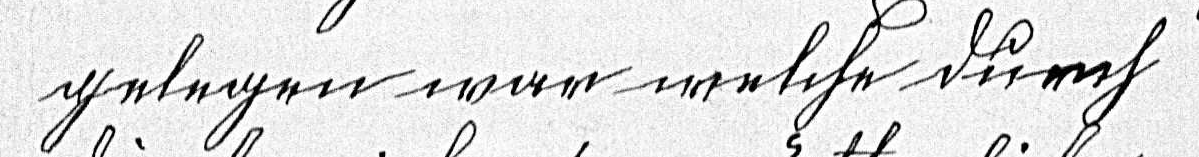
gelegen war welche durch
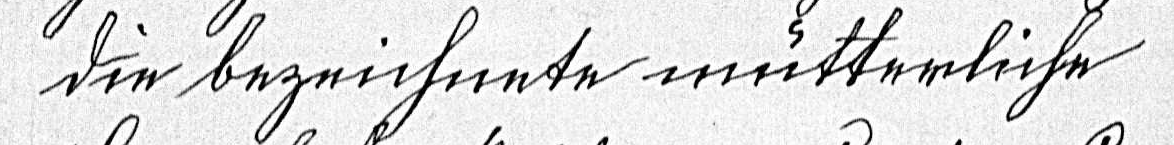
die bezeichnete mütterliche
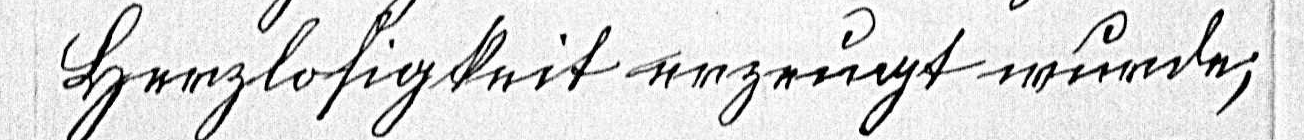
Herzlosigkeit erzeugt wurde,
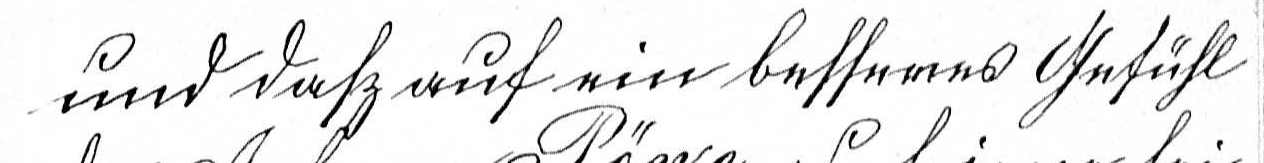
und daß auf ein besseres Gefühl
